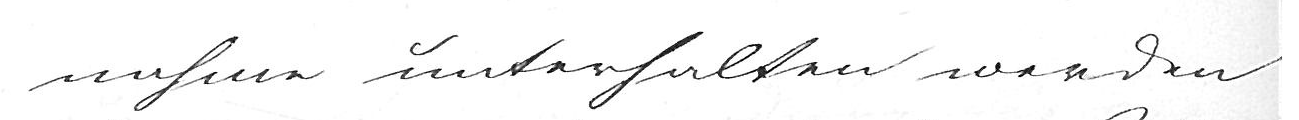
nahme unterhalten werden
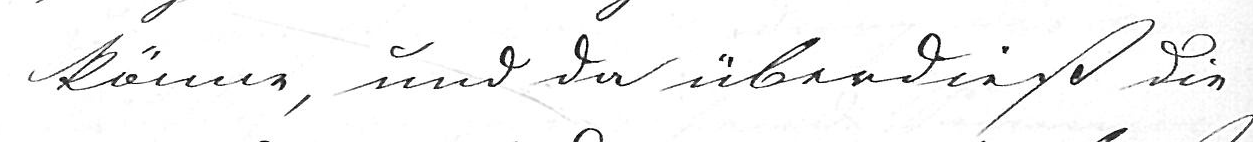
könne, und da überdieß die
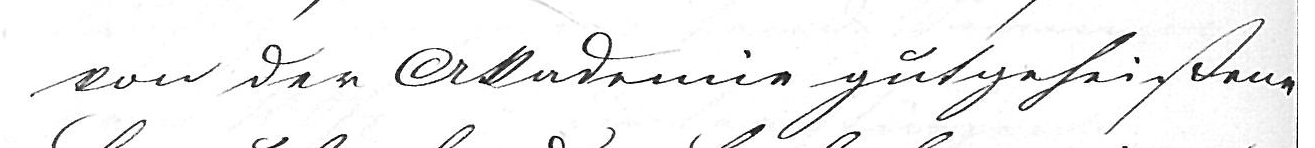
von der Akademie gutgeheißene
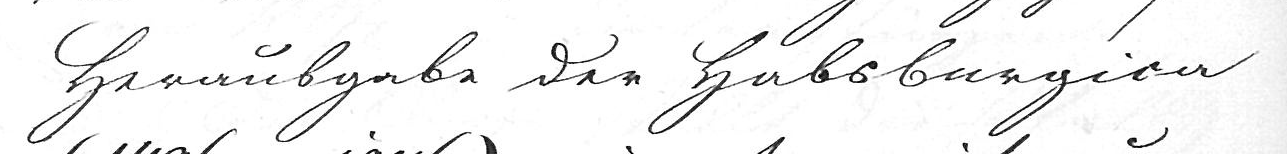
Herausgabe der Habsburgica
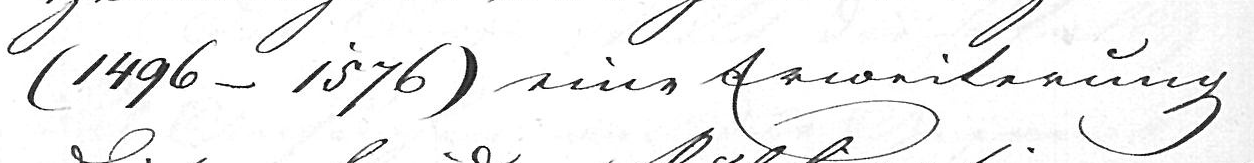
(1496-1576) eine Erweiterung
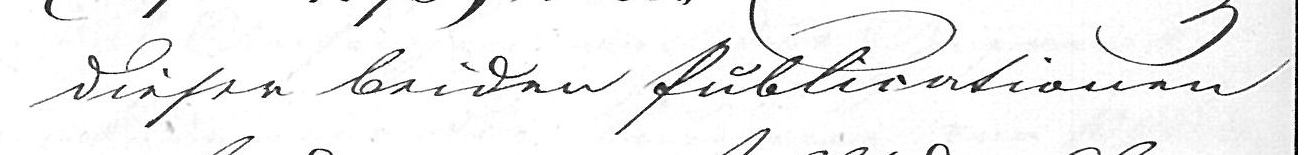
dieser beiden Publicationen
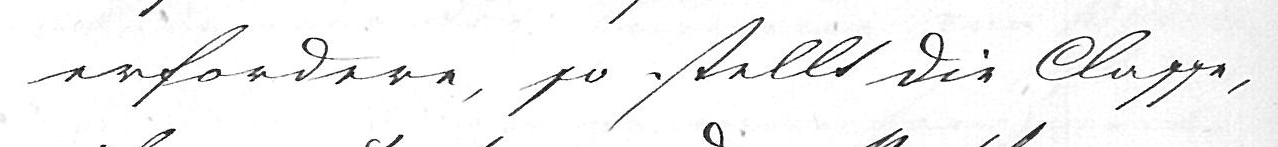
erfordere, so stellt die Classe,
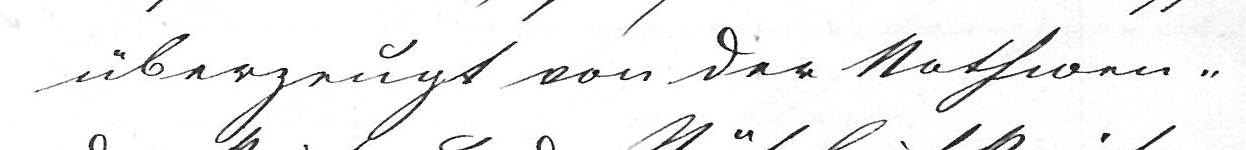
überzeugt von der Nothwen-
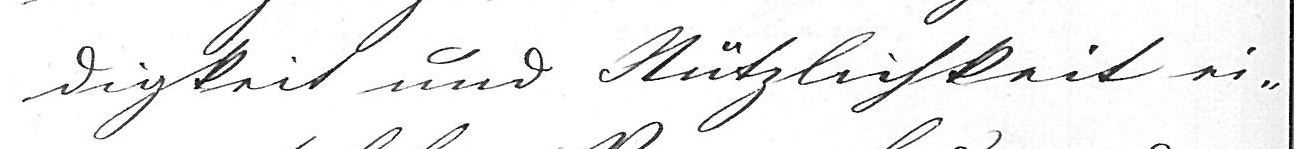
digkeit und Nützlichkeit ei-
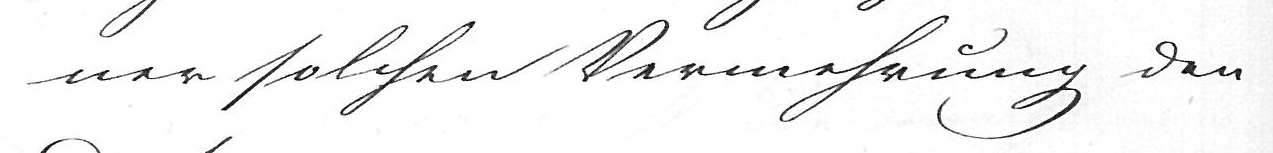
ner solchen Vermehrung den
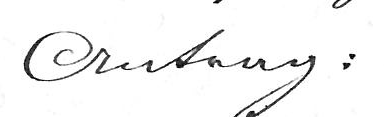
Antrag:
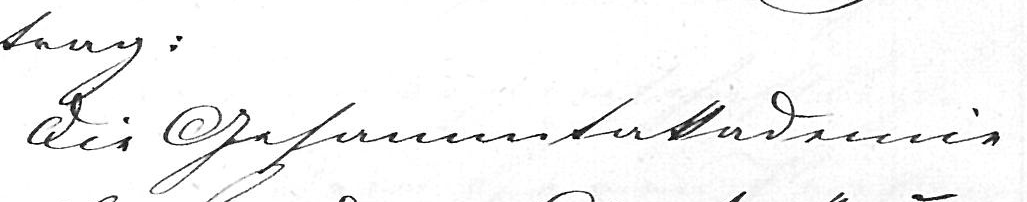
Die Gesammtakademnie
